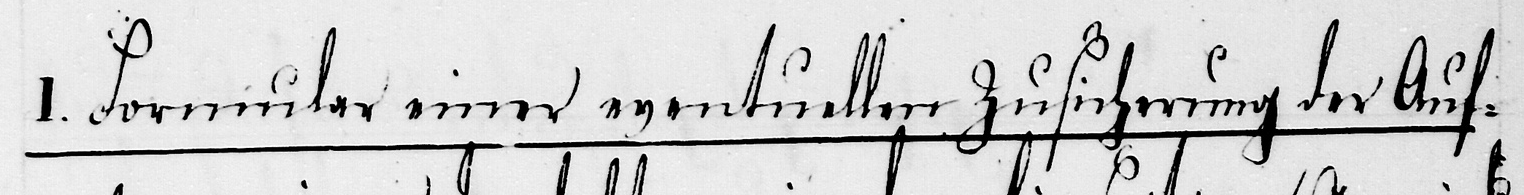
I. Formular einer eventuellen Zusicherung der Auf¬
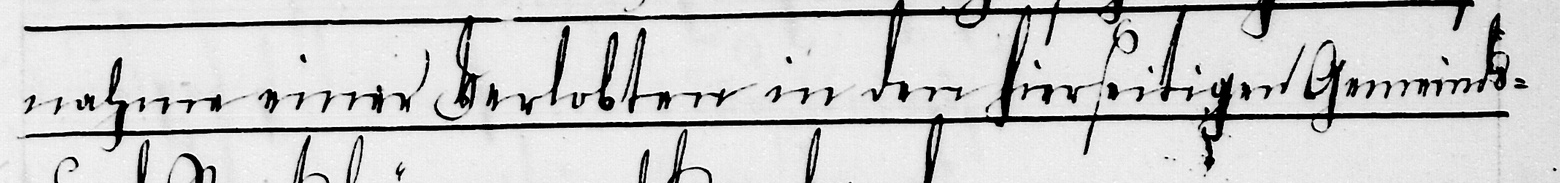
nahme einer Verlobten in den hierseitigen Gemeinds-
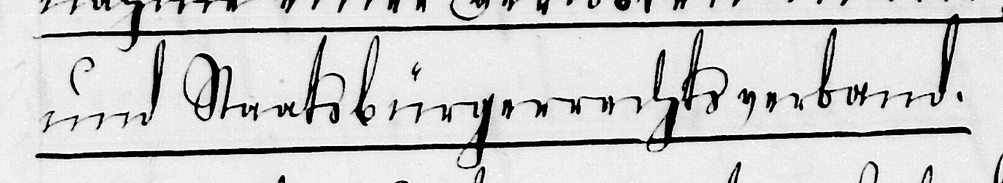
und Staatsbürgerrechtsverband.
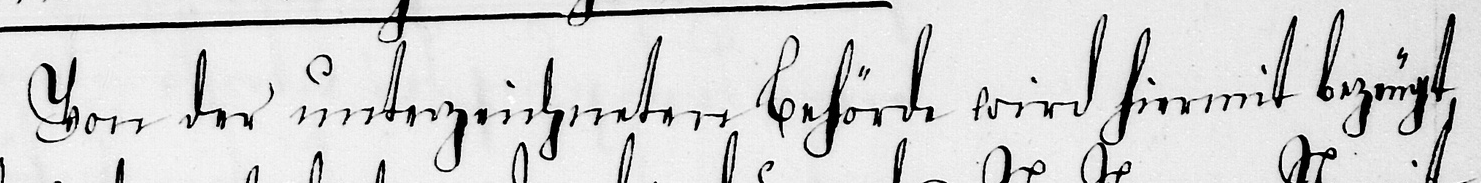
Von der unterzeichneten Behörde wird hiermit bezeugt,
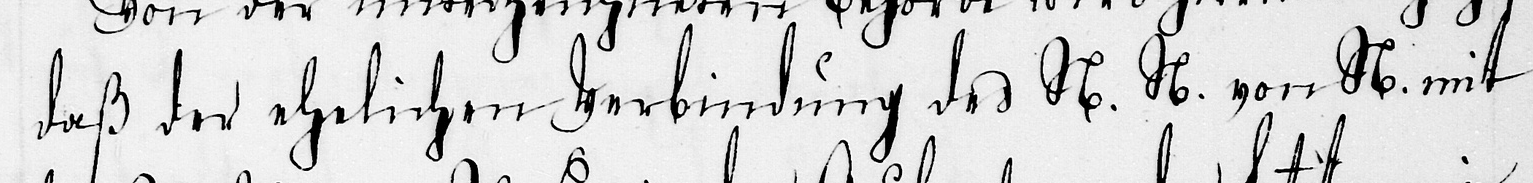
daß der ehelichen Verbindung des N. N. von N. mit
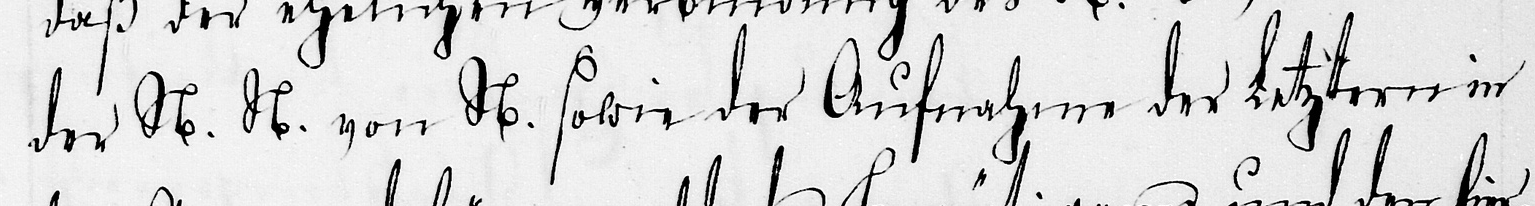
der N. N. von N. sowie der Aufnahme der Letztern in
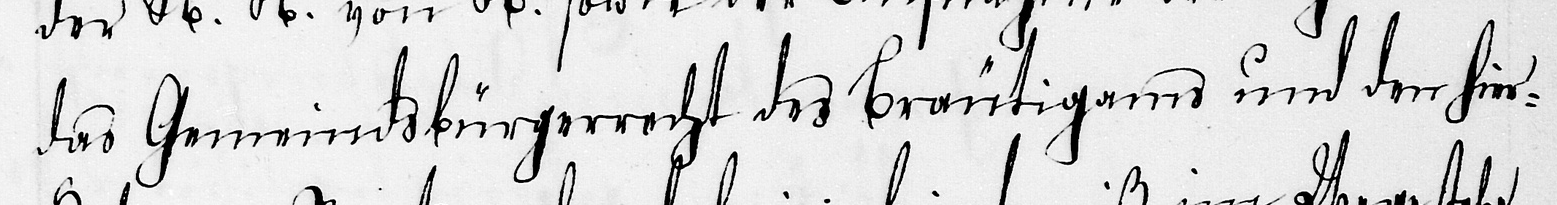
das Gemeindsbürgerrecht des Bräutigams und den hier¬
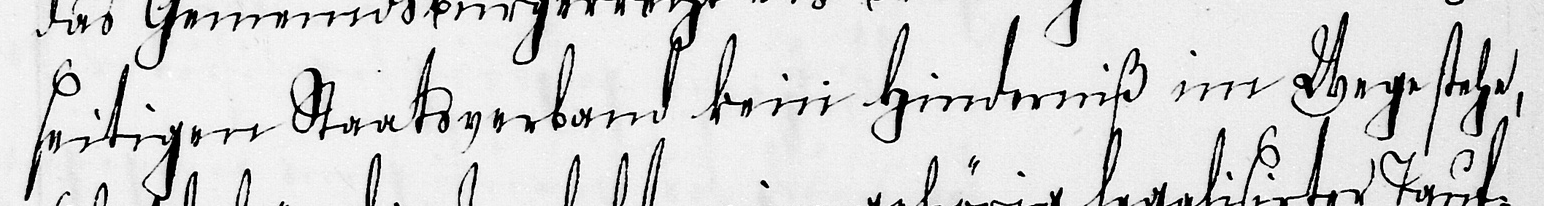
seitigen Staatsverband kein Hinderniß im Wege stehe,
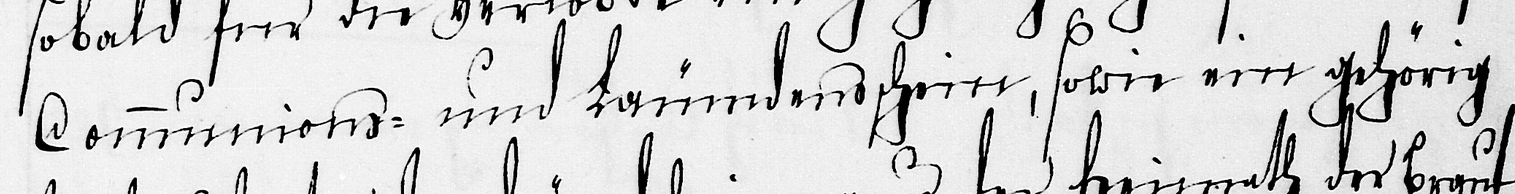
Communions- und Läumdensschein, sowie ein gehörig
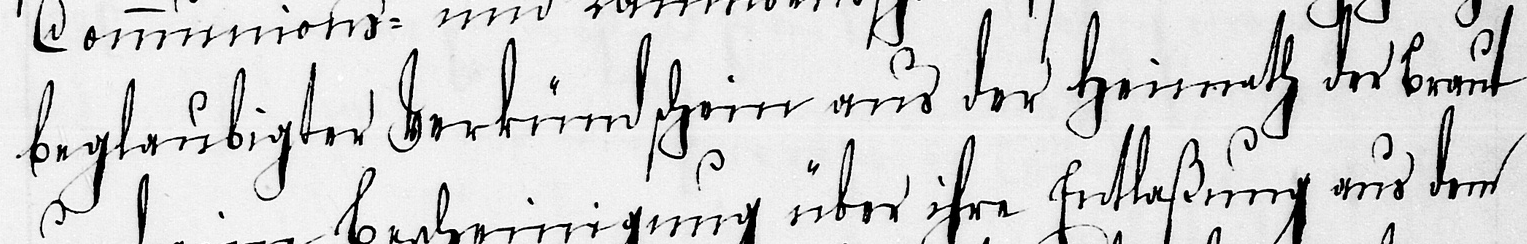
beglaubigter Verkündschein aus der Heimath der Braut
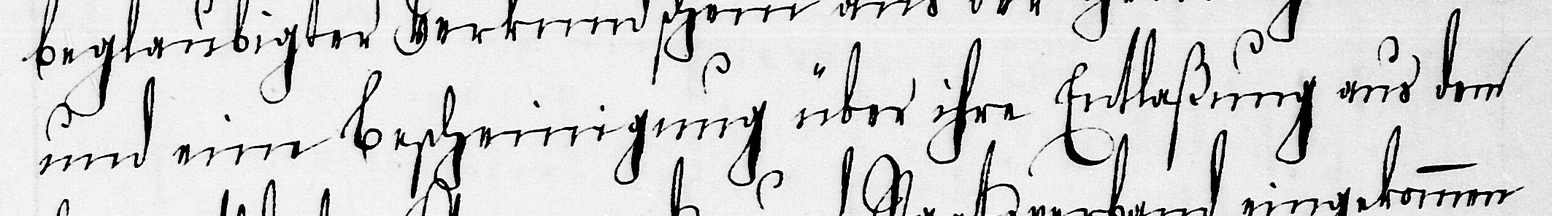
und eine Bescheinigung über ihre Entlaßung aus dem
